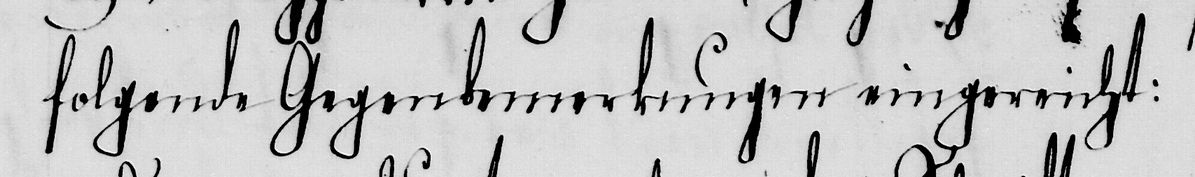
folgende Gegenbemerkungen eingereicht:
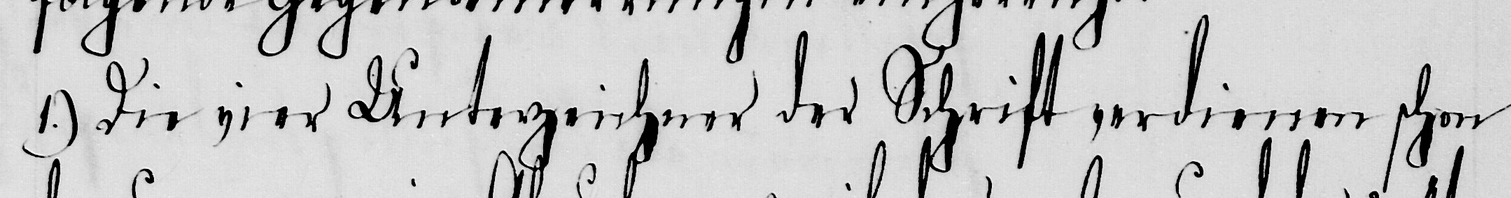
1.) Die vier Unterzeichner der Schrift verdienen schon
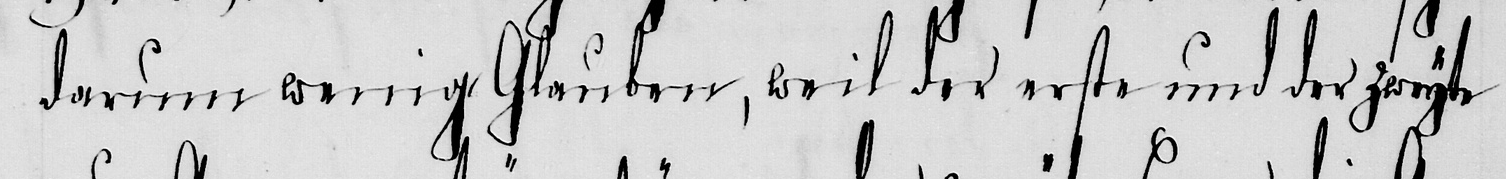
darum wenig Glauben, weil der erste und der zweyte
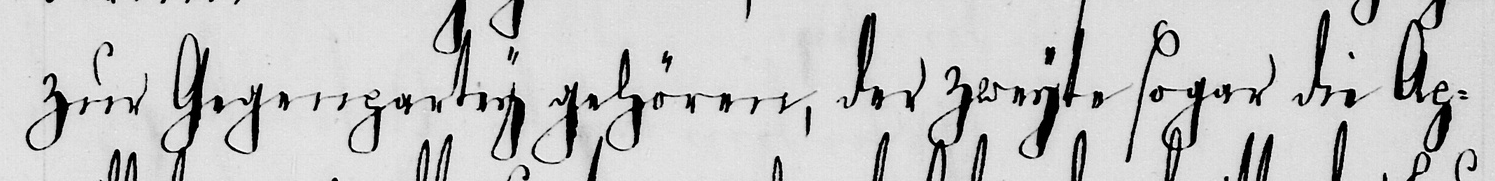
zur Gegenpartey gehören, der zweyte sogar die Ap¬
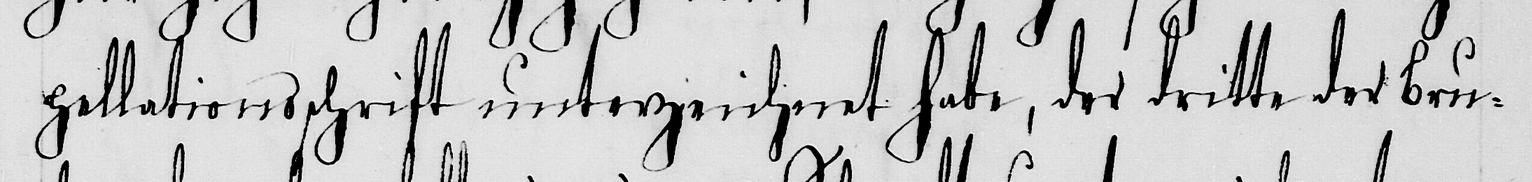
pellationsschrift unterzeichnet habe, der dritte der Bru¬
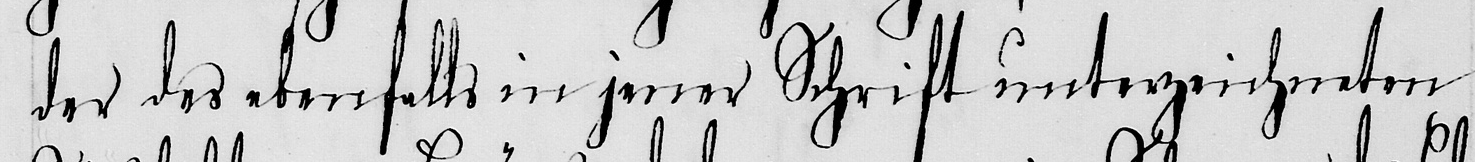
der des ebenfalls in jener Schrift unterzeichneten
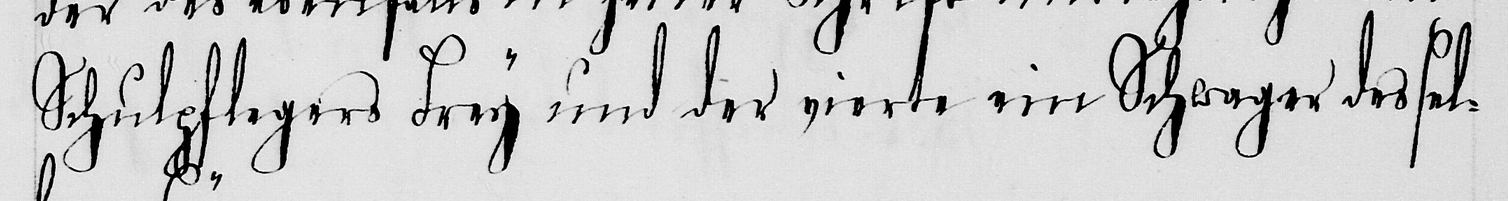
Schulpflegers Frey und der vierte ein Schwager dessel¬
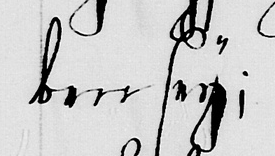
ben sey;
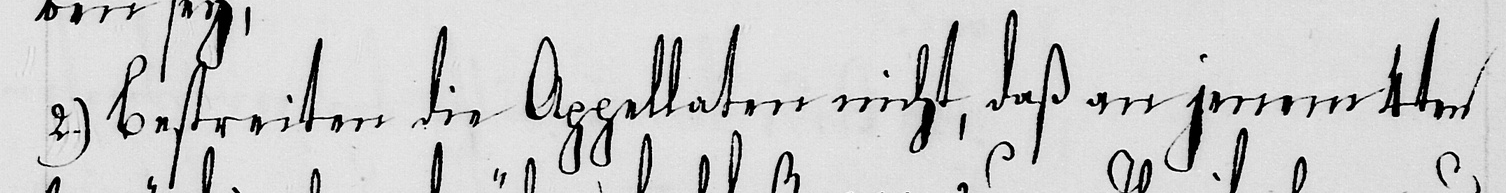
2.) Bestreiten die Appellaten nicht, daß an jenem 4ten
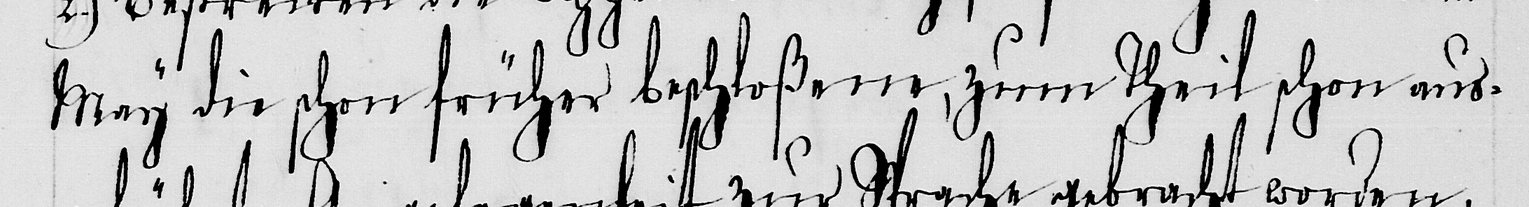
May die schon früher beschloßene, zum Theil schon aus¬
